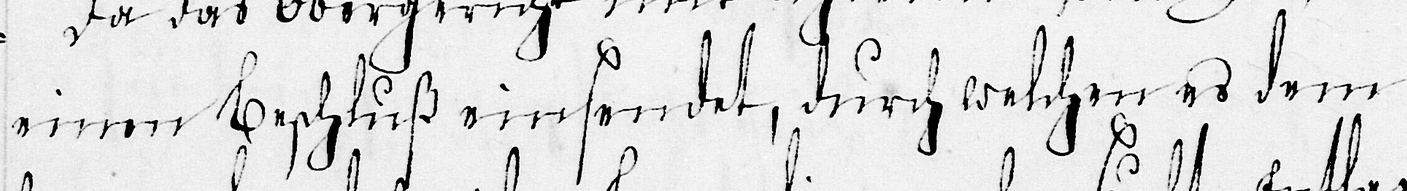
einen Beschluß einsendet, durch welchen es dem
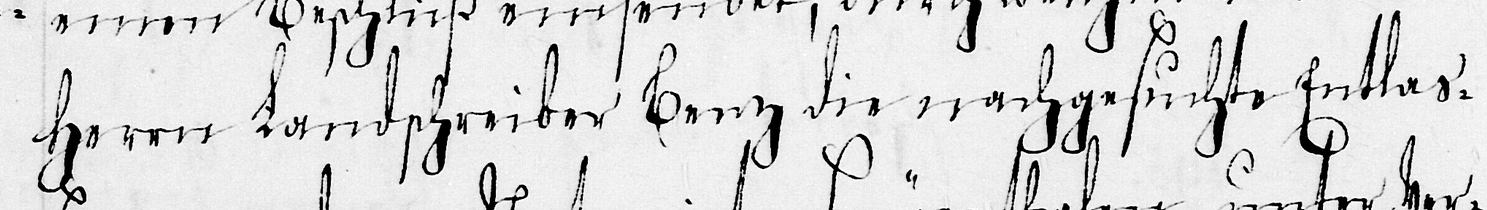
Herrn Landschreiber Benz die nachgesuchte Entla¬
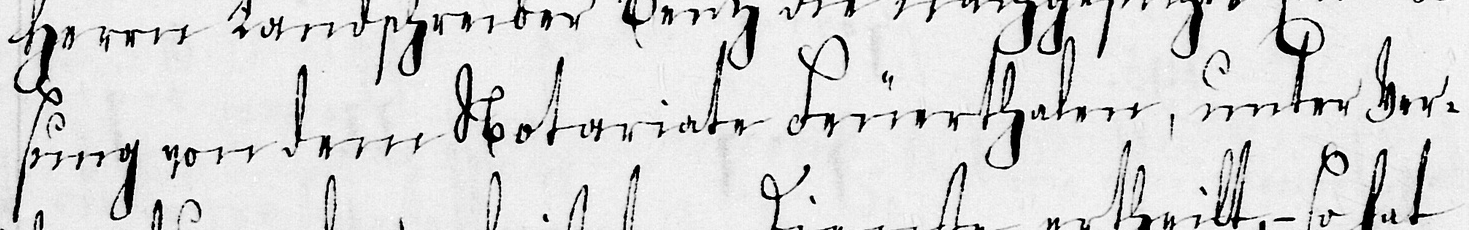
ßung von dem Notariate Feuerthalen, unter Ver¬
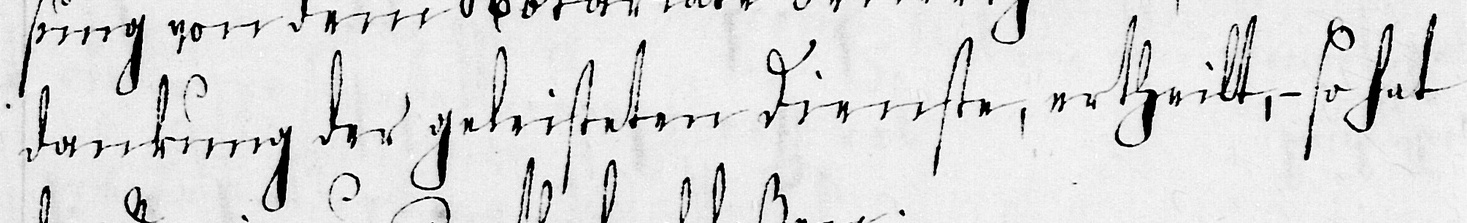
dankung der geleisteten Dienste, ertheilt, – so hat
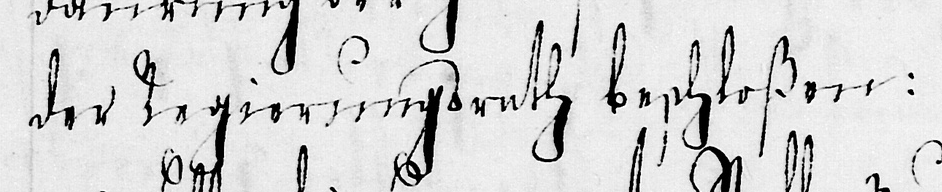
der Regierungsrath beschloßen:
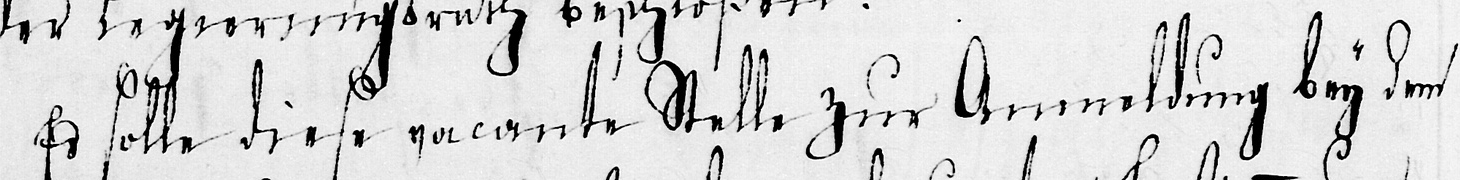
Es solle diese vacante Stelle zur Anmeldung bey dem
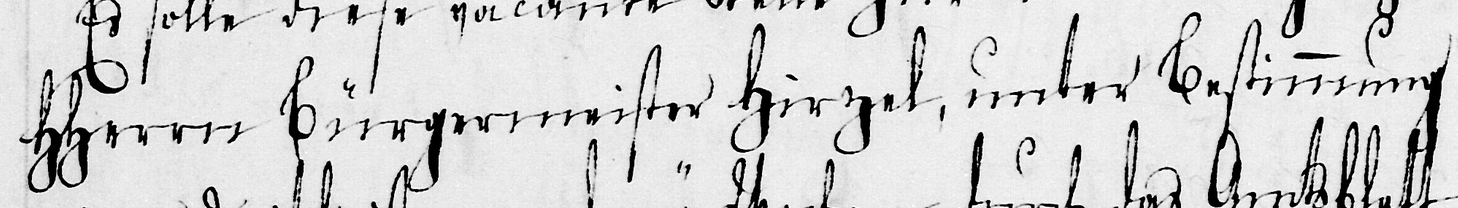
HHerrn Bürgermeister Hirzel, unter Bestimmung
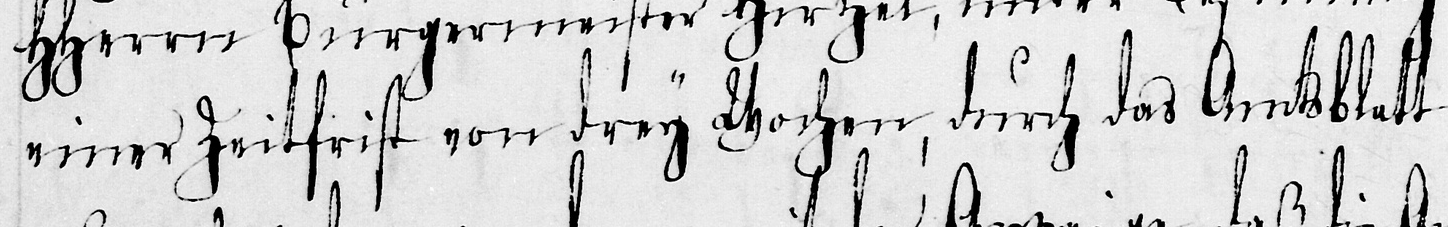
einer Zeitfrist von drey Wochen, durch das Amtsblatt
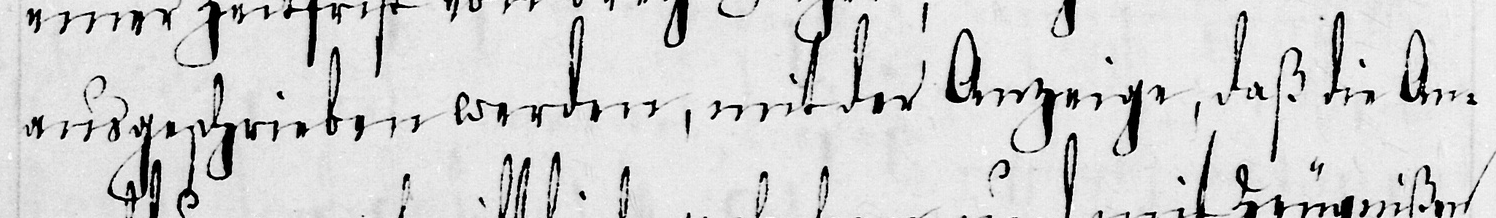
ausgeschrieben werden, mit der Anzeige, daß die An¬
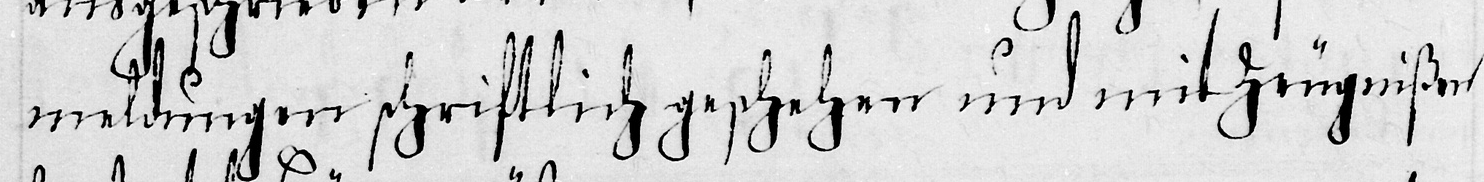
meldungen schriftlich geschehen und mit Zeugnißen
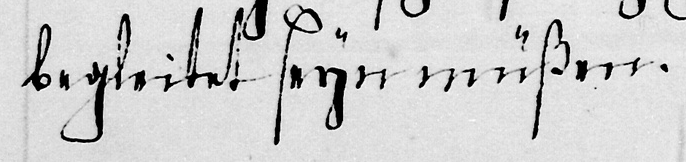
begleitet seyn müßen.
